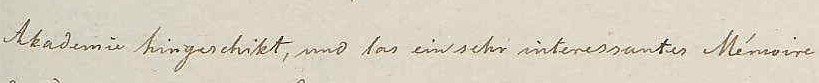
Akademie hingeschikt, und las ein sehr interessantes Mémoire
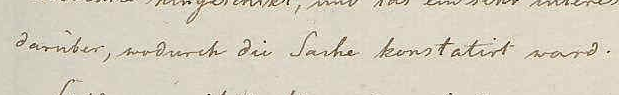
darüber, wodurch die Sache konstatirt ward.
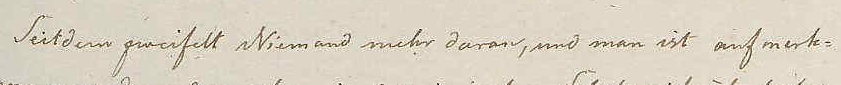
Seitdem zweifelt Niemand mehr daran, und man ist aufmerk-
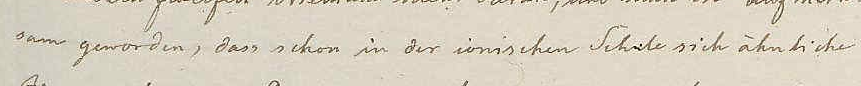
sam geworden, dass schon in der ionischen Schule sich ähnliche
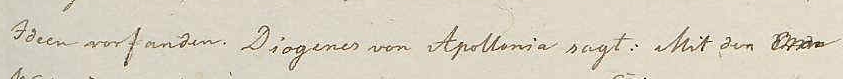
Ideen vorfanden. Diogenes von Apollonia sagt: Mit den Erd-
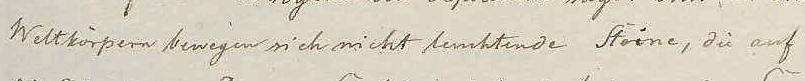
Weltkörpern bewegen sich nicht leuchtende Sterine, die auf
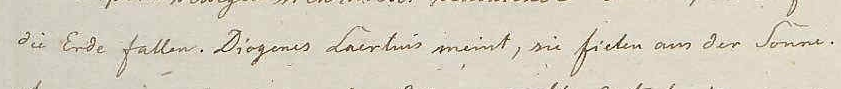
die Erde fallen. Diogenes Laërtius meint, sie fielen aus der Sonne.
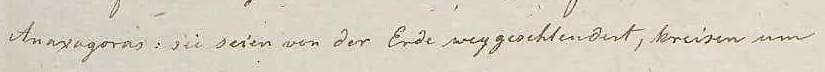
Anaxagoras: die seien von der Erde weggeschleudert, kreisen um
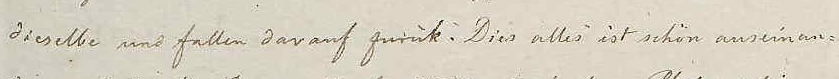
dieselbe und fallen darauf zurük. Dies alles ist schön auseinan-
